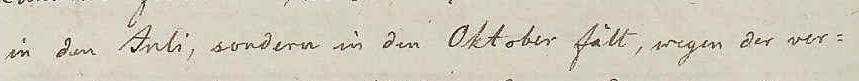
in den Juli, sondern in den Oktober fält, wegen der ver-
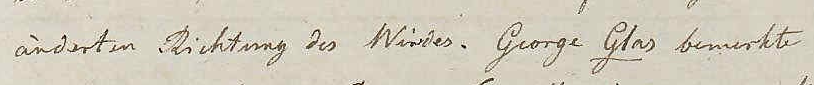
änderten Richtung des Windes. George Glas bemerkte
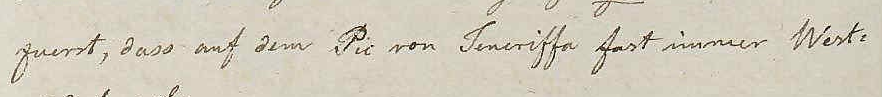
zuerst, dass auf dem Pic von Teneriffa fast immer West-
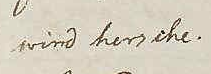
wind hersche.
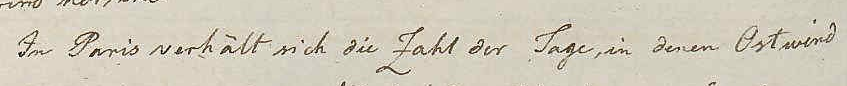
In Paris verhält sich die Zahl der Tage, in denen Ostwind
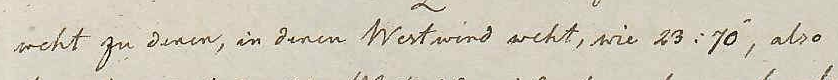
weht zu denen, in denen Westwind weht, wie 23:70, also
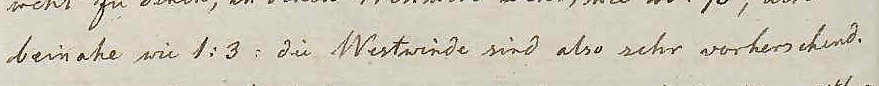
beinahe wie 1:3: die Westwinde sind also sehr vorherschend.
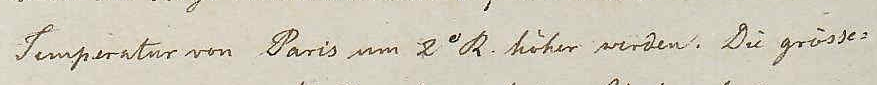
Temperatur von Paris um 2° R. höher werden. Die grösse-
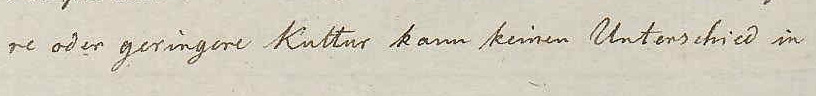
re oder geringere Kultur kann keinen Unterschied in
